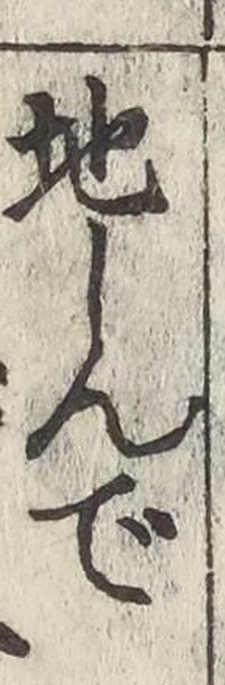地しんで

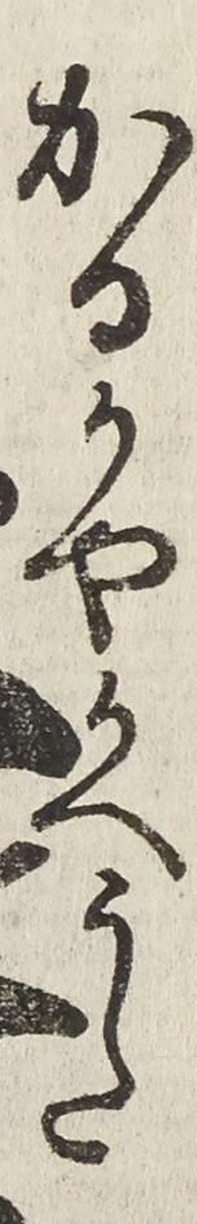かるかやかへうた
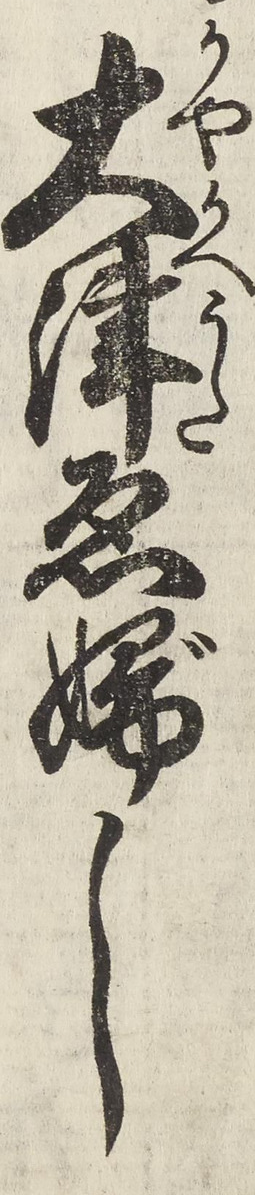大津ゑぶし
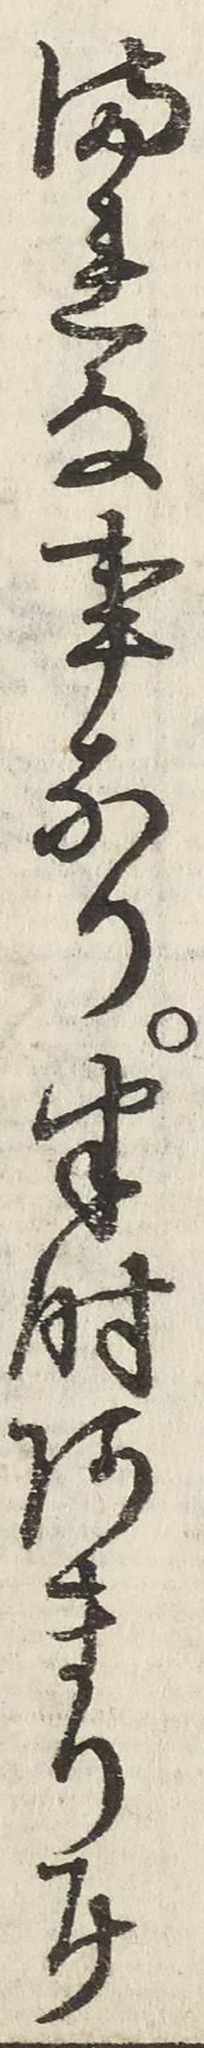まれな事なり。半時あまりに
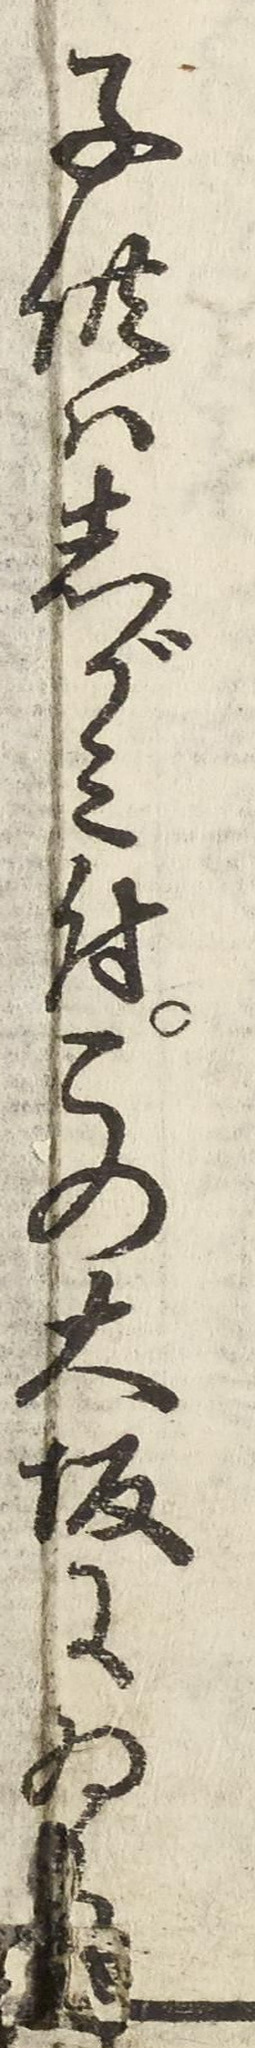子供はしがみ付。この大坂にゐら
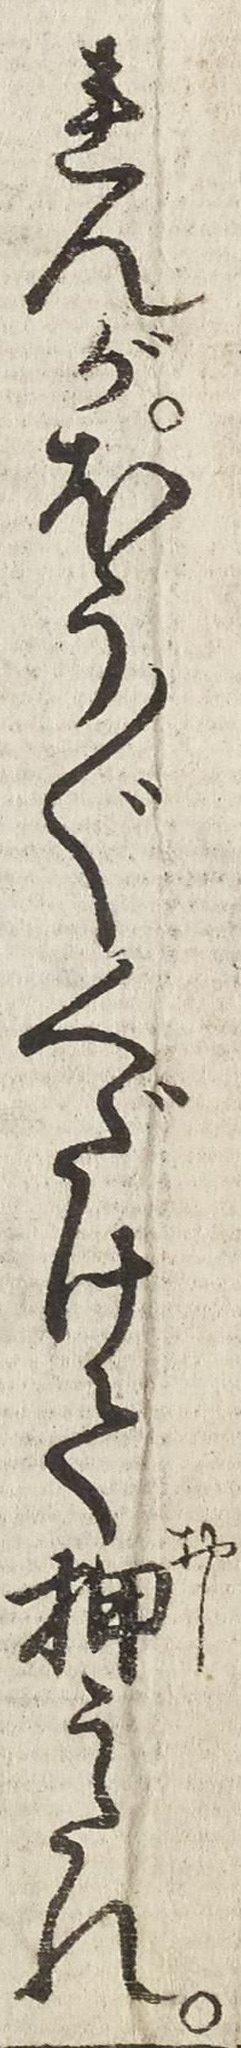れんが。ほう〴〵くだけて押おしうたれ
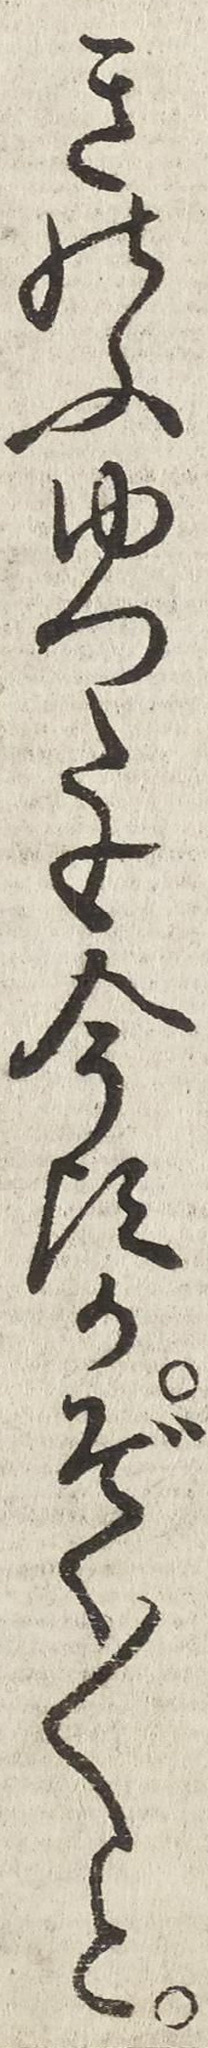きのふゆつたも今頃か。ぞく〳〵と。
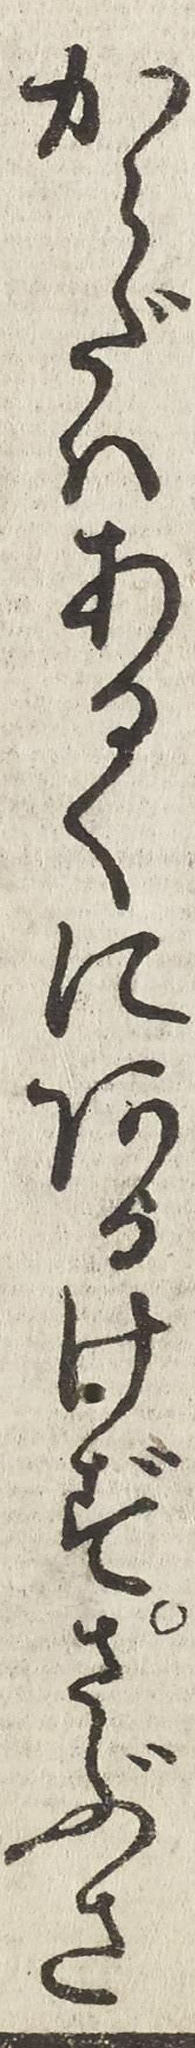からだはあるくにあるけず。さぶさ
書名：大地震大津浪末代噺種　（二編　全）
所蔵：東京大学地震研究所図書室 Earthquake Research Institute Library, The University of Tokyo, JAPAN
